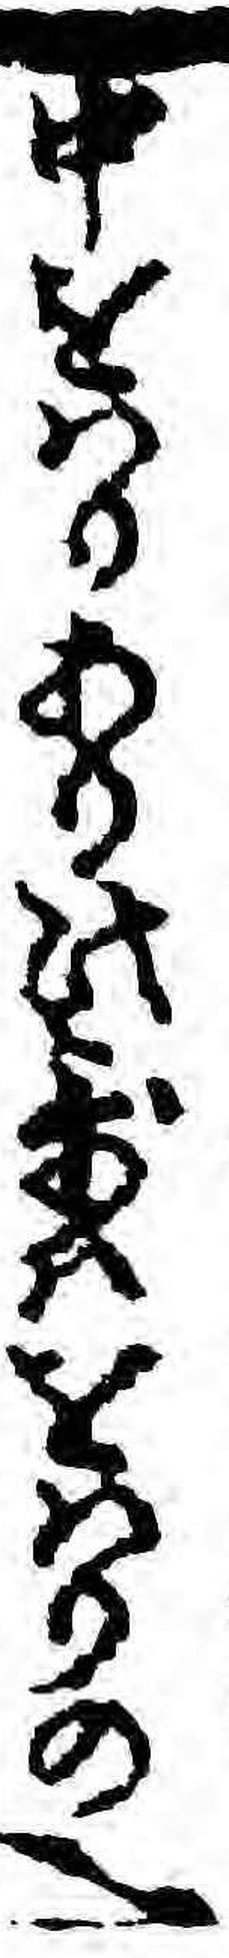中をはりあり此哥はをはりの
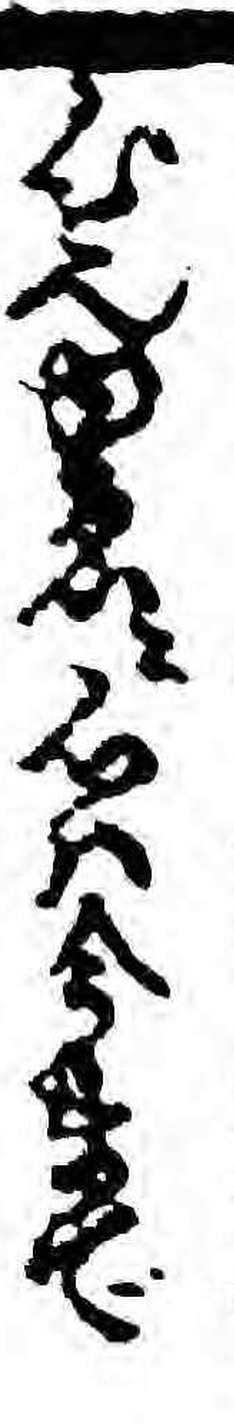心也ゆゑに心は今まで
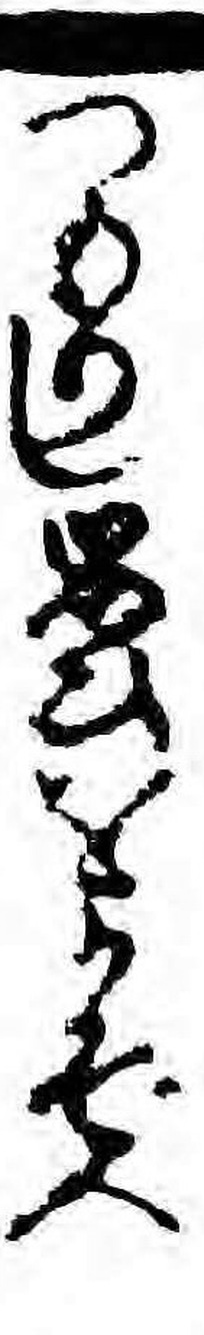つもりし思ひをかぞへ
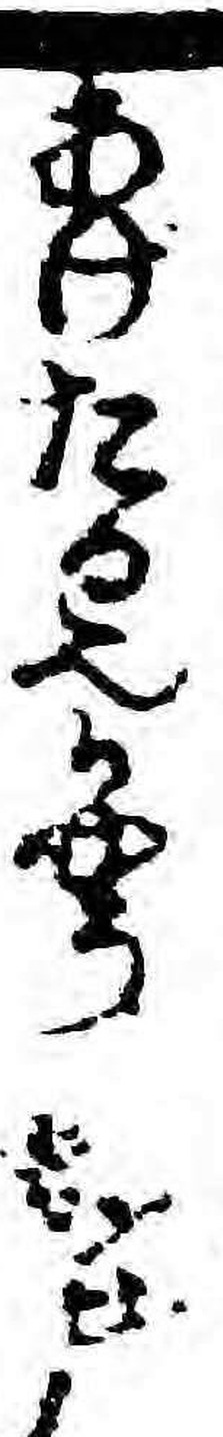あげたる也かやう
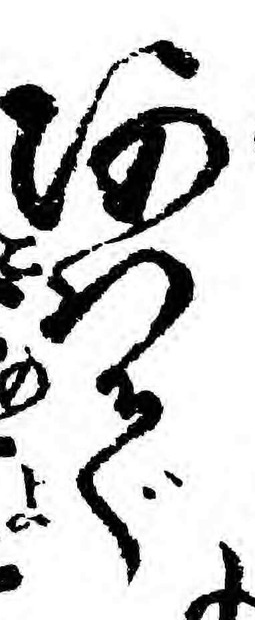あわで
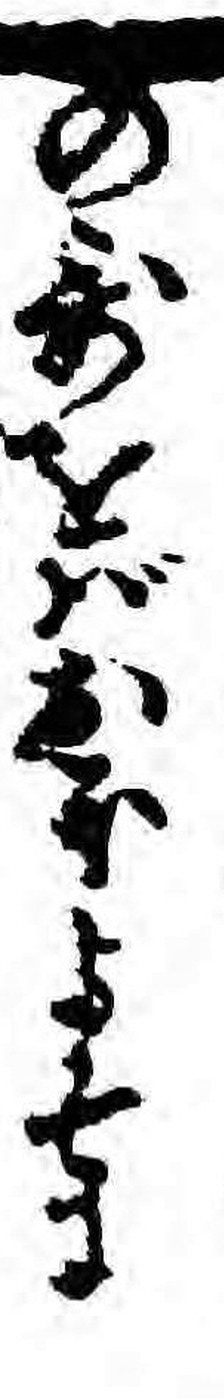の哥をばおほよそに
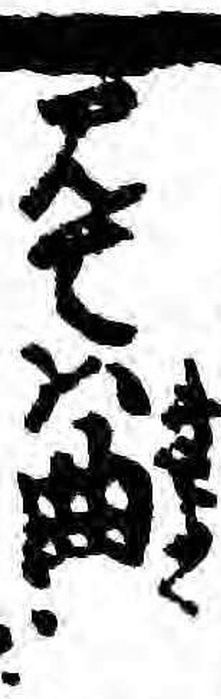見ては曲
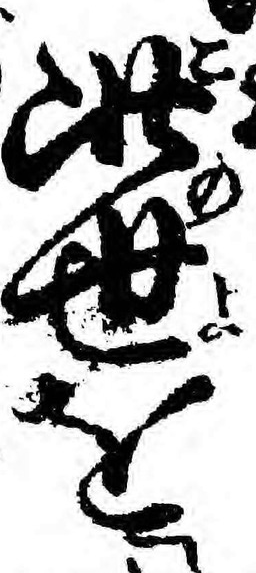此世を
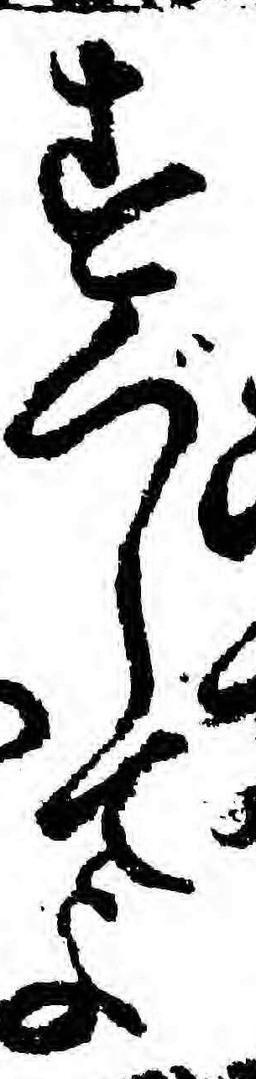すぐしてよ
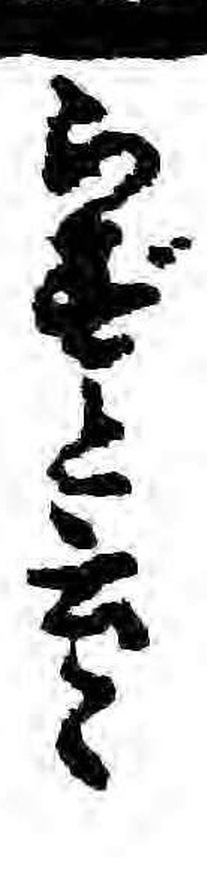らずと云々

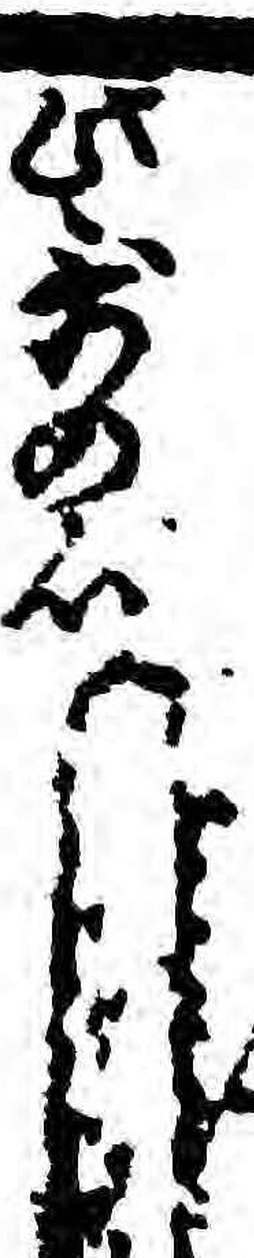此哥の心
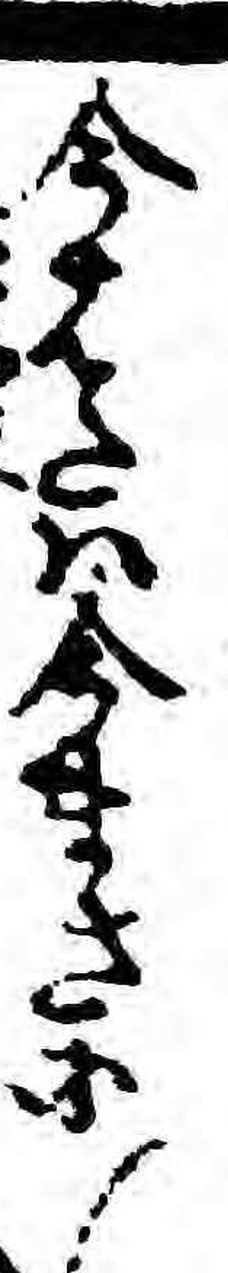今はたは今まさに
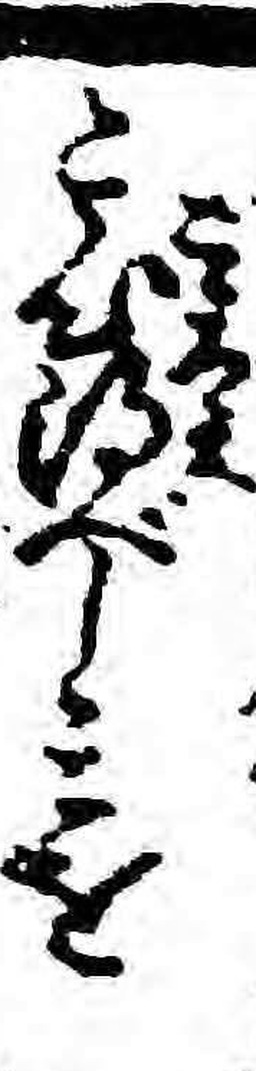と心得べしみを
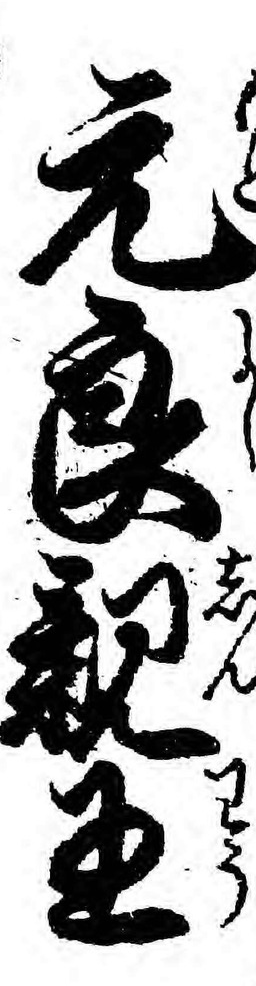元良親王
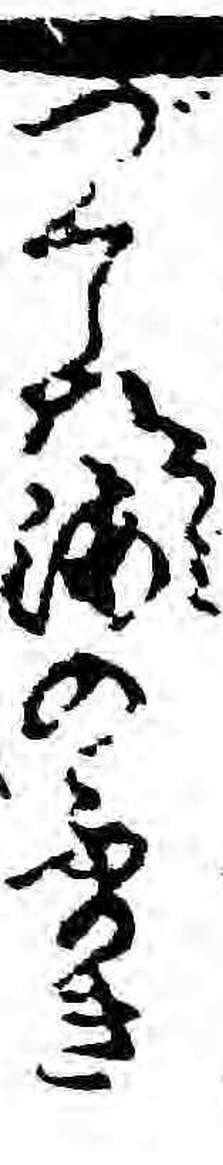づくしは海のふかき
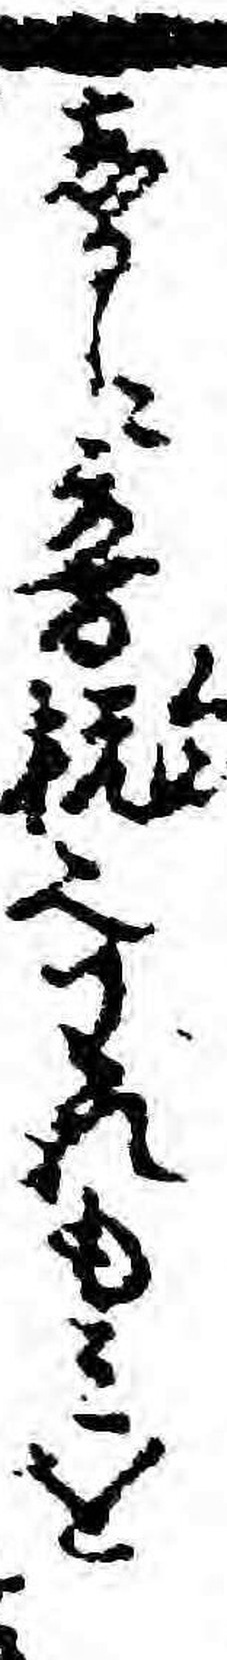しるしに立る杭也われもみを
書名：頭書和歌注譯／壽賀多百人一首小倉錦
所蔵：国文学研究資料館
